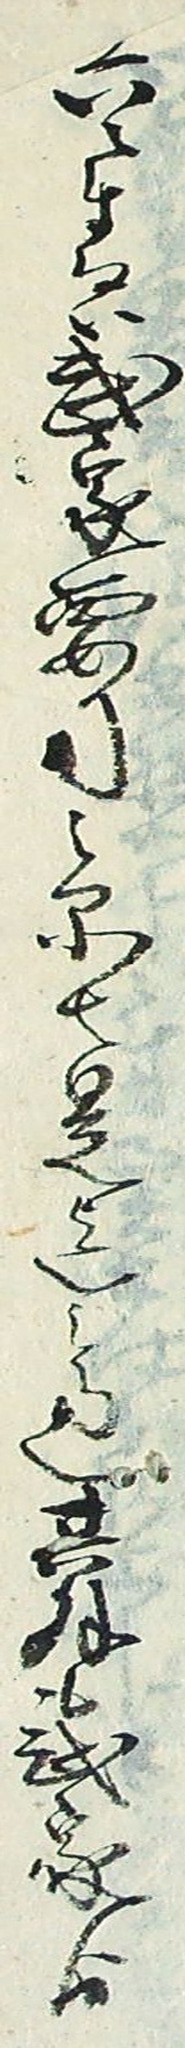右に付而は武家要用之品は是迄之通其外も武家ゟ

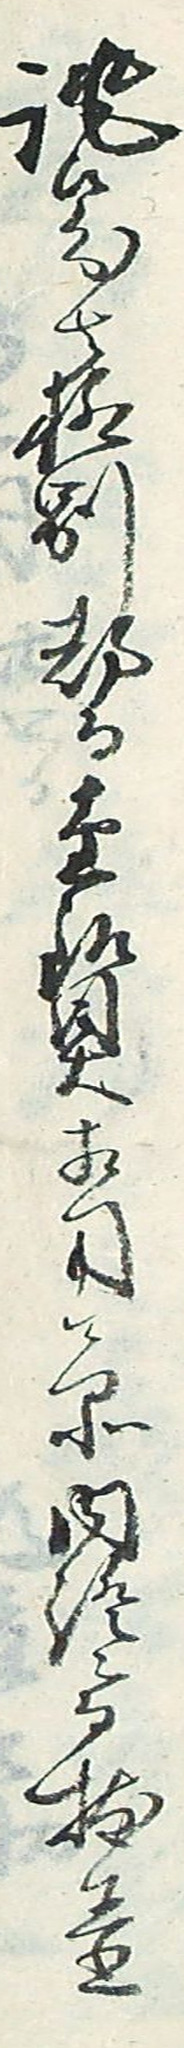誂候分は格別都而金銀具相用候品内證に而抜置
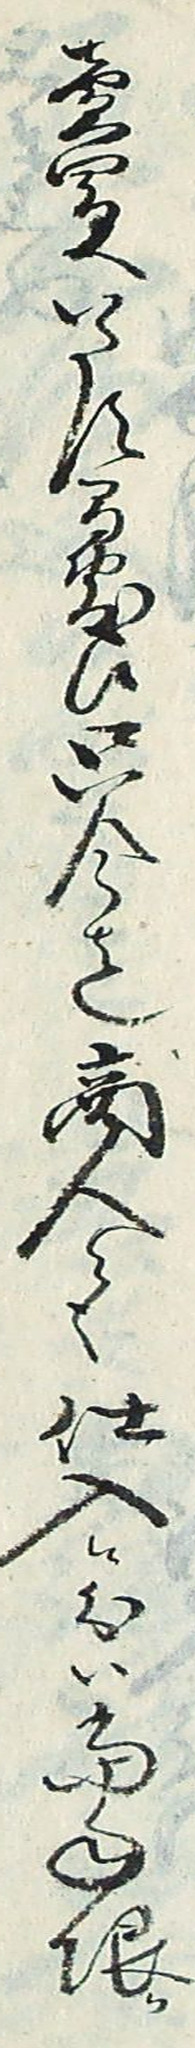売買いたす間敷候只今迄商人とも仕入候分は当年限り
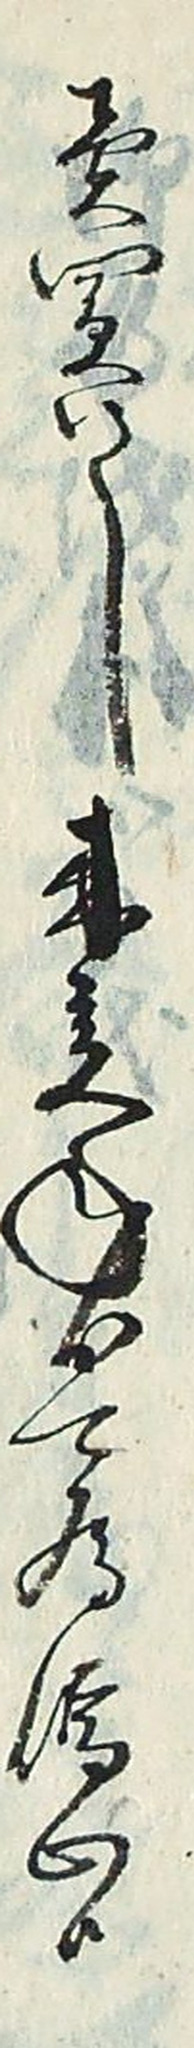売買いたし来亥年ゟ可為停止候
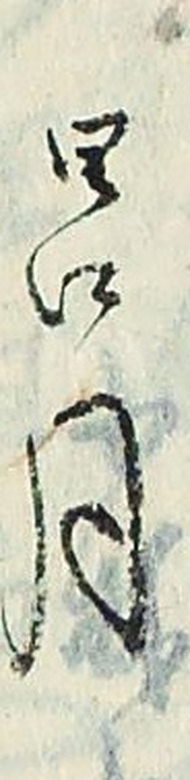閏四月
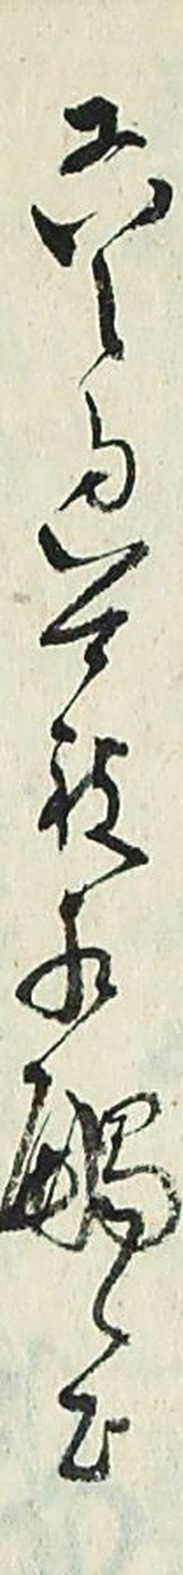右之通可被相触候以上
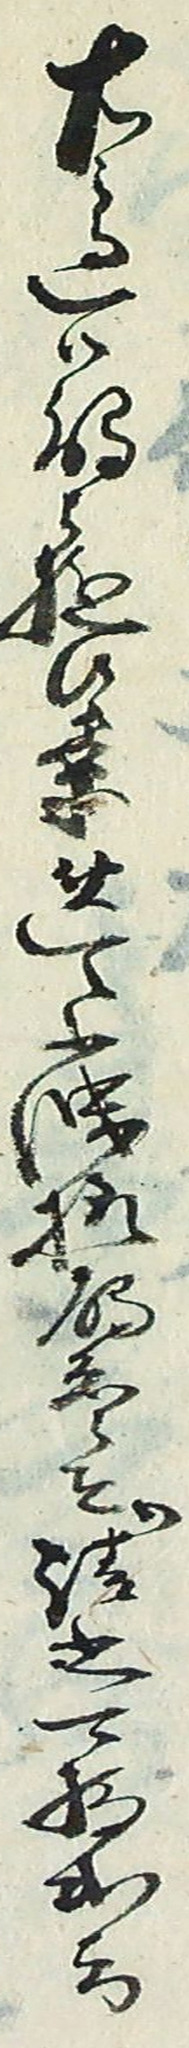右之通御触被遊候条逸々不洩様触知らせ御請書
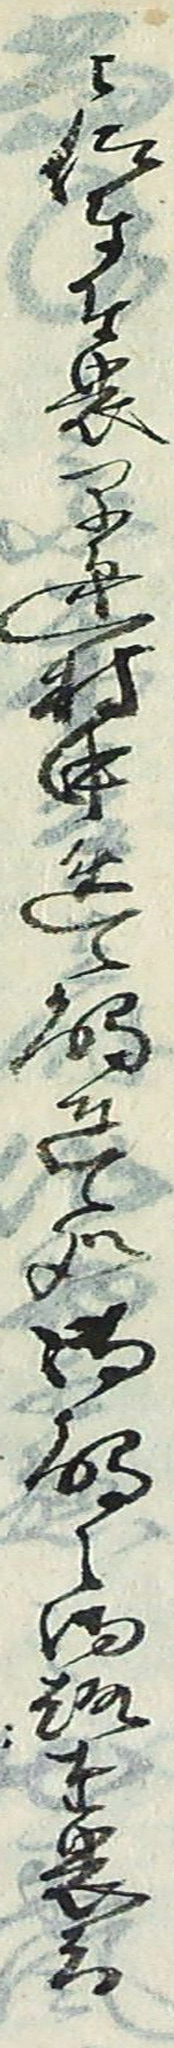被仰付奉畏早速村中逸々触達候処御触之御趣奉畏旨
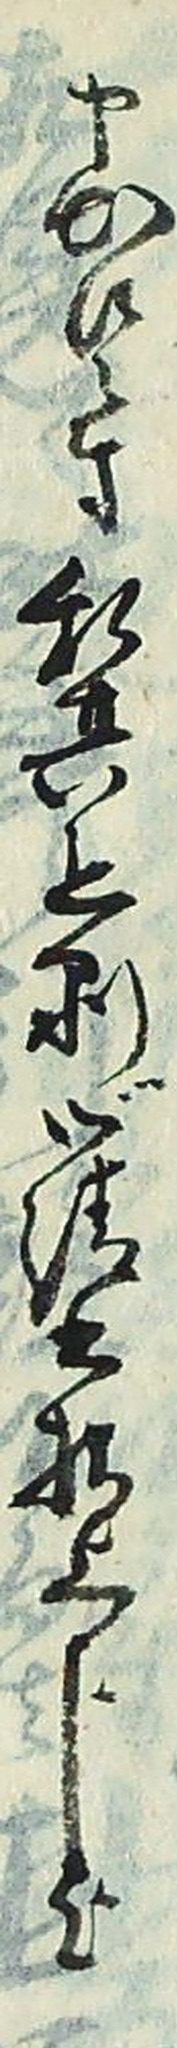申出候に付私共連判御請書指上申候以上
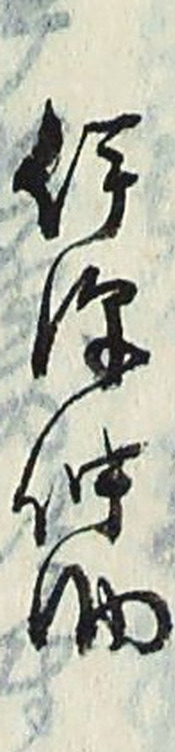伊澤仲助
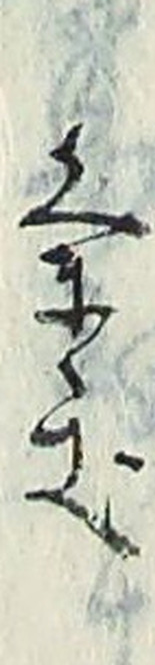久米之丈
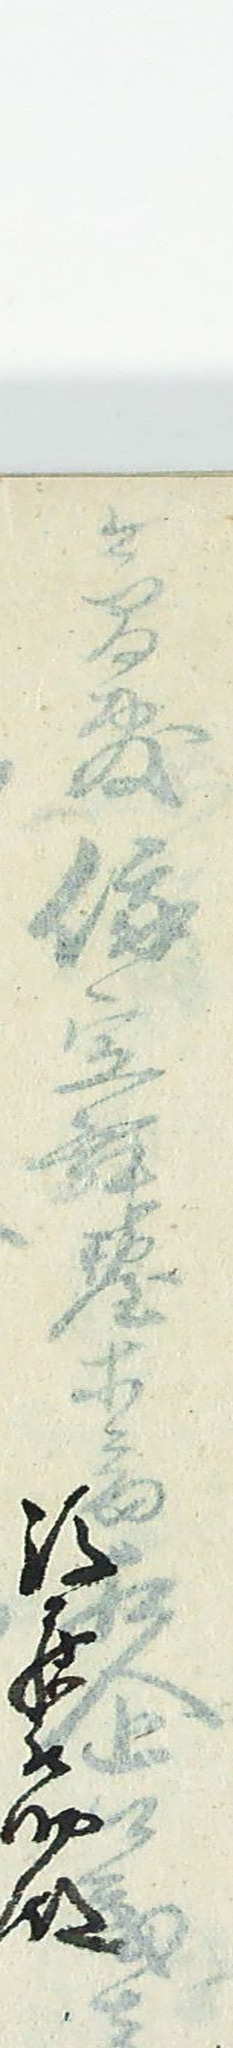後藤善助殿
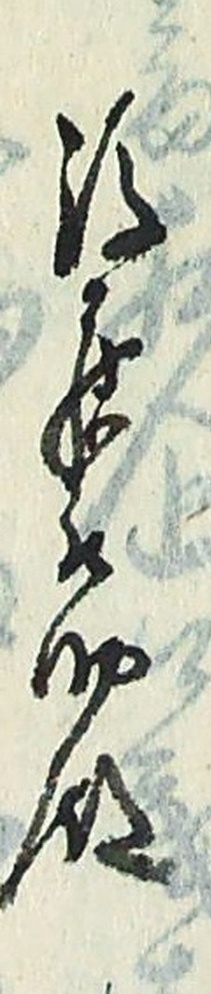後藤善助殿
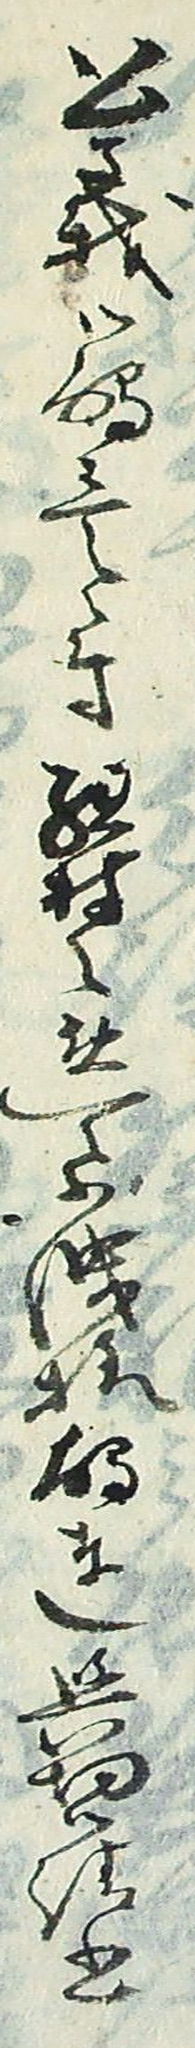公義御触有之候に付組村々逸々不洩様触達与切御請書
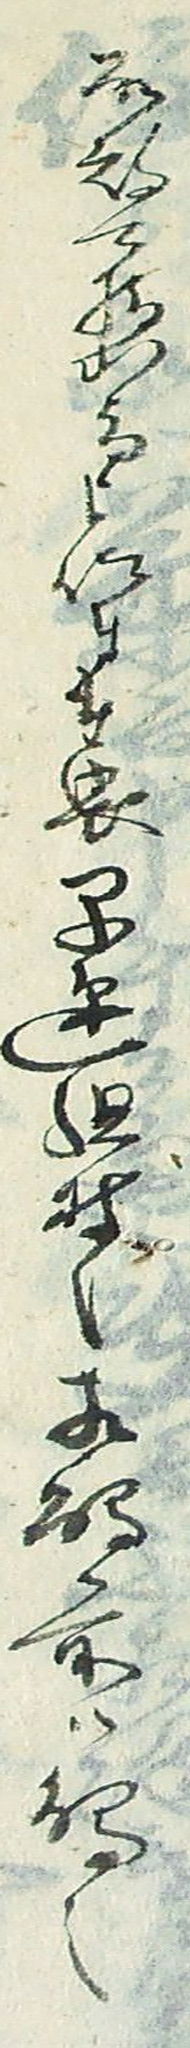取都可指出旨被仰付奉畏早速組村々相触候所御触之
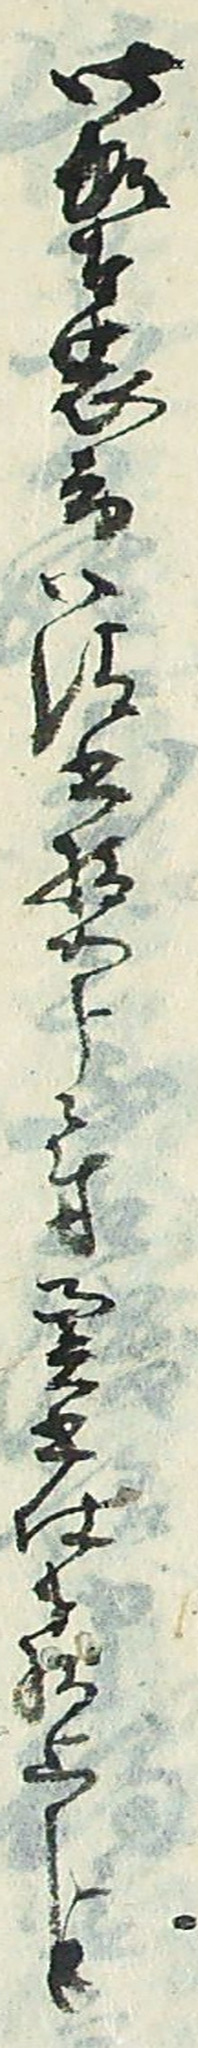御趣奉畏旨御請書指出申に付奥書仕奉指上申候
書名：諸御用御□受書控
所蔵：鳴門教育大学 Naruto University of Education
